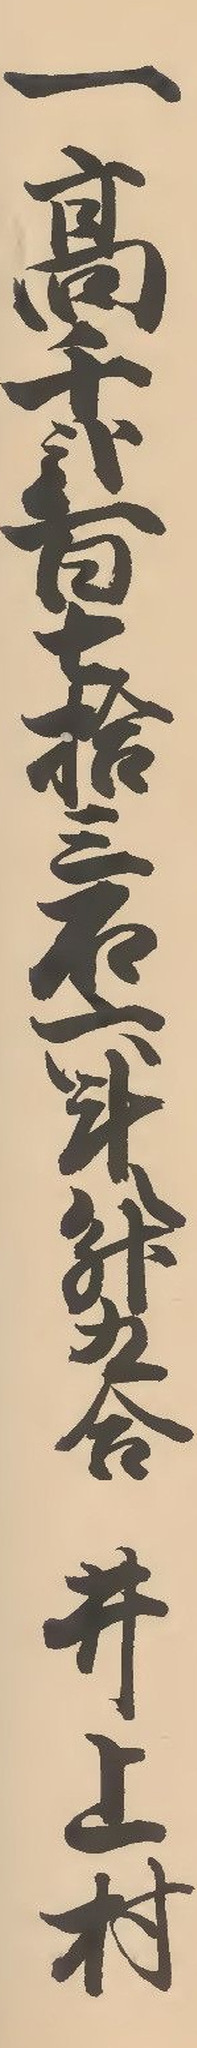一髙千弐百七拾三石六斗八升九合井上村
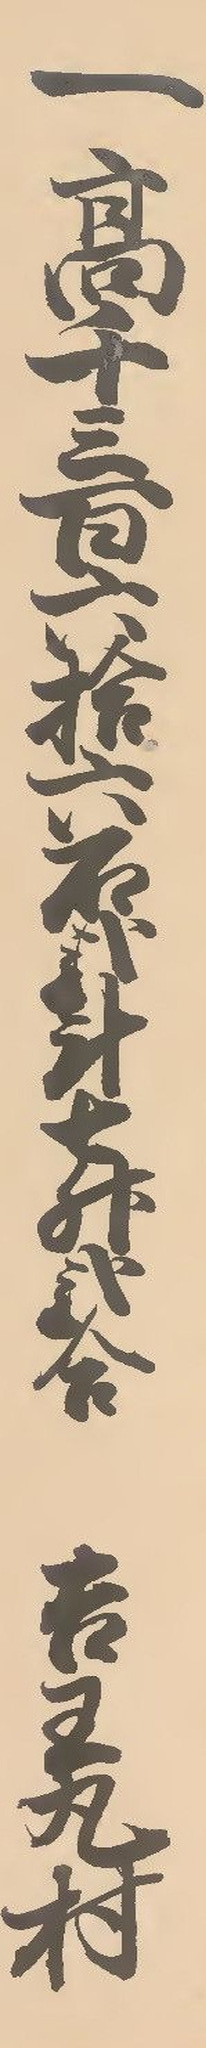一髙千三百六拾六石弐斗七升弐合吉王丸村
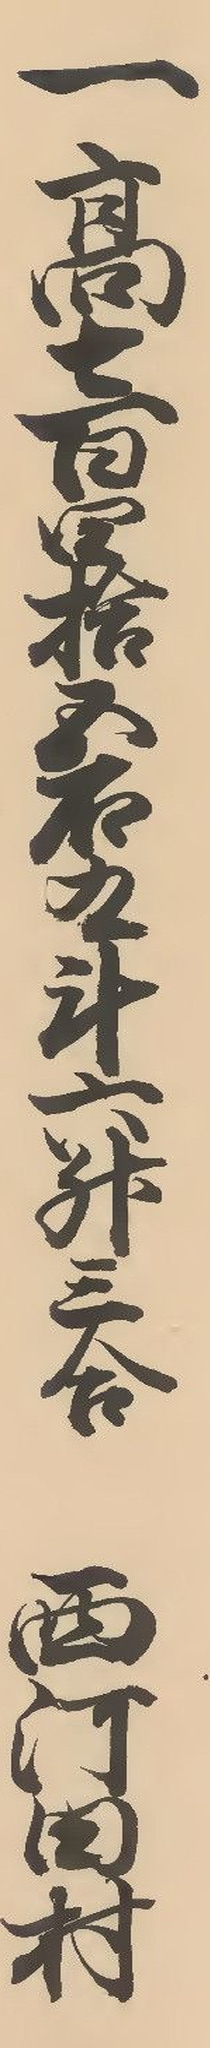一髙七百四拾五石九斗六升三合西河田村
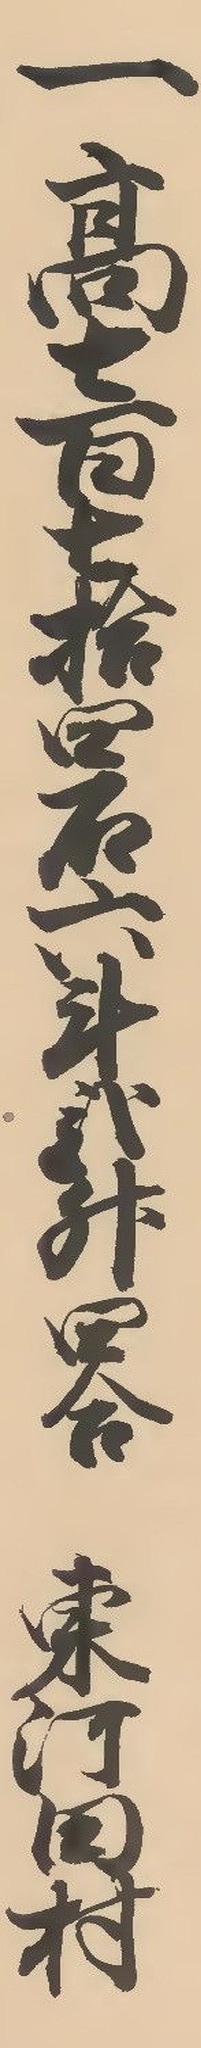一髙七百七拾四石六斗弐升四合東河田村
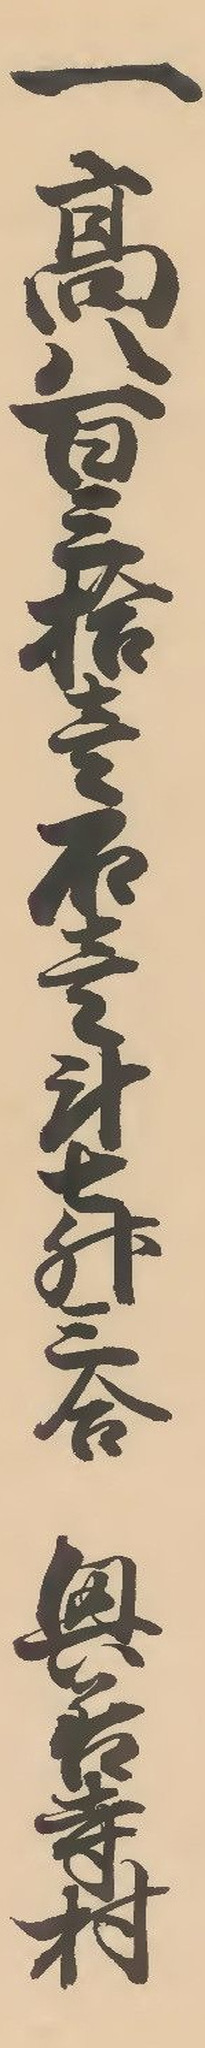一髙八百三拾壱石壱斗七升三合奥寺村

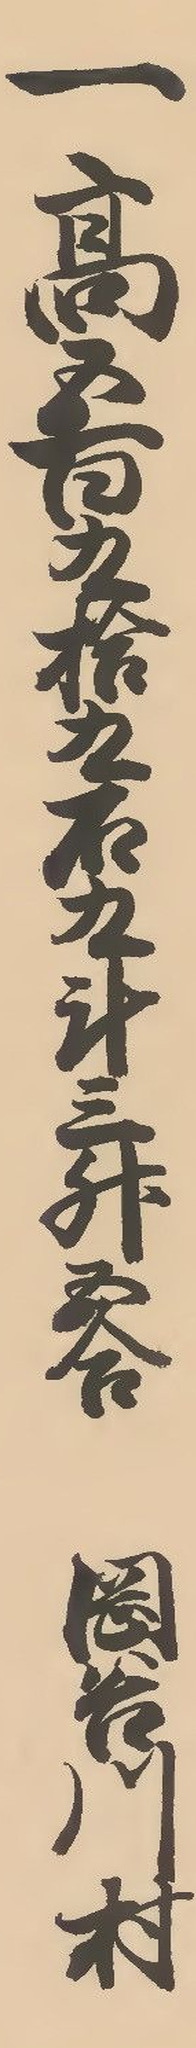一髙五百九拾九石九斗三升五合岡谷川村
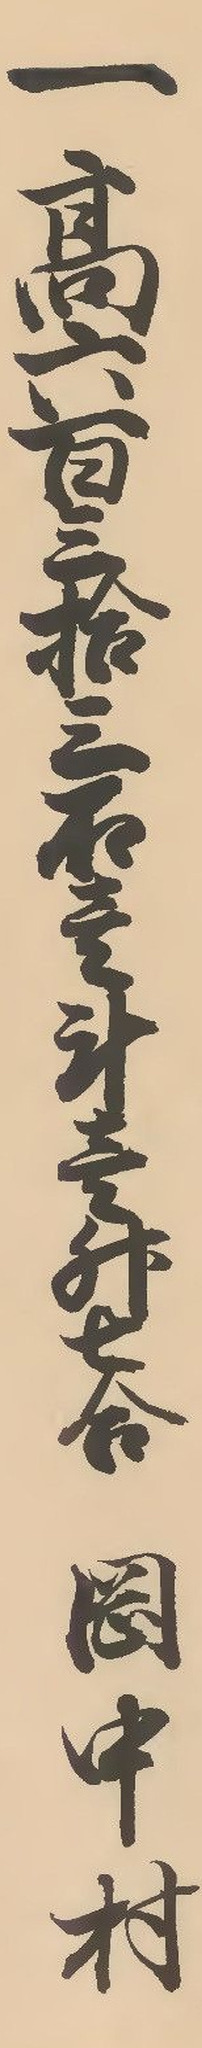一髙六百三拾三石壱斗壱升七合岡中村
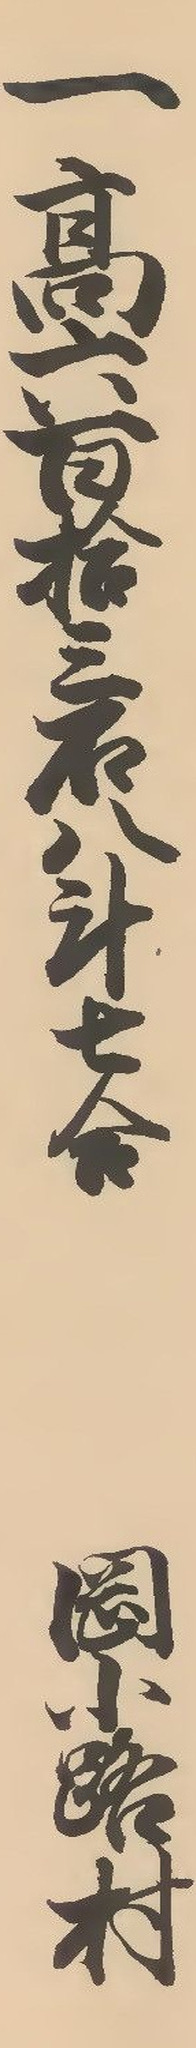一髙六百拾三石八斗七合岡小路村
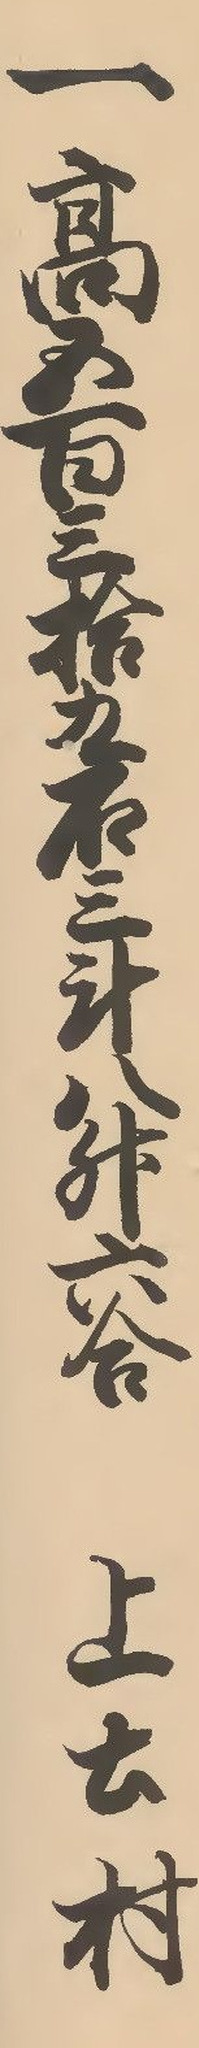一髙五百三拾九石三斗八升六合上土村
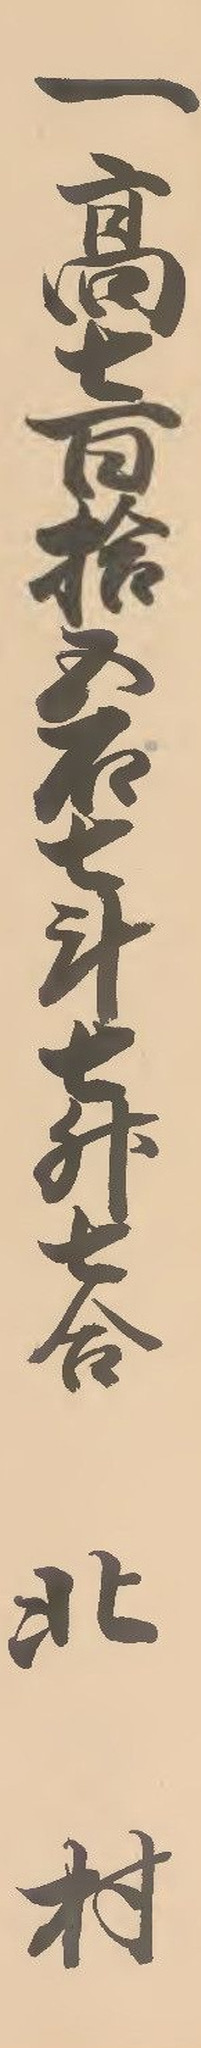一髙七百拾五石七斗七升七合北村
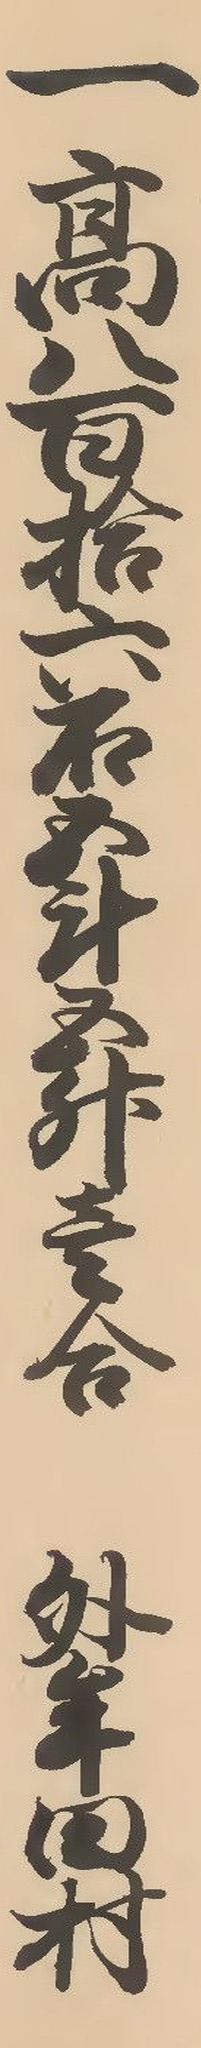一髙八百拾六石五斗五升壱合外牟田村
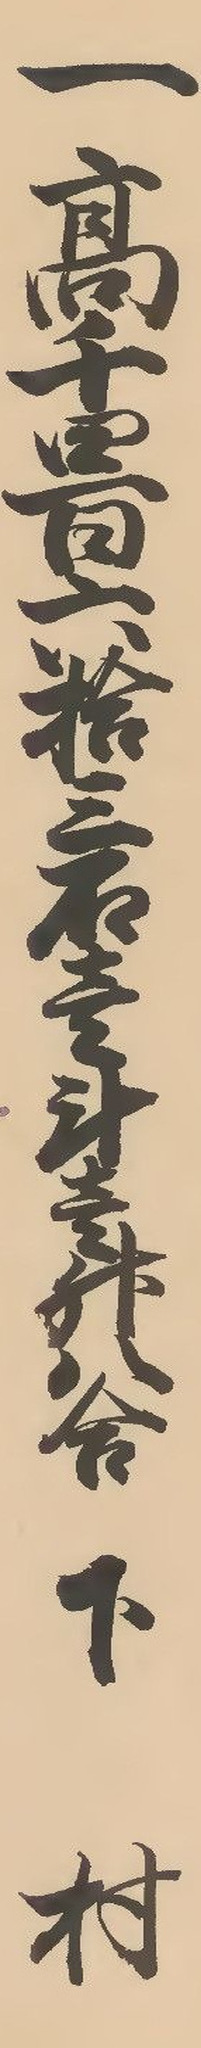一髙千四百六拾三石壱斗壱升八合下村
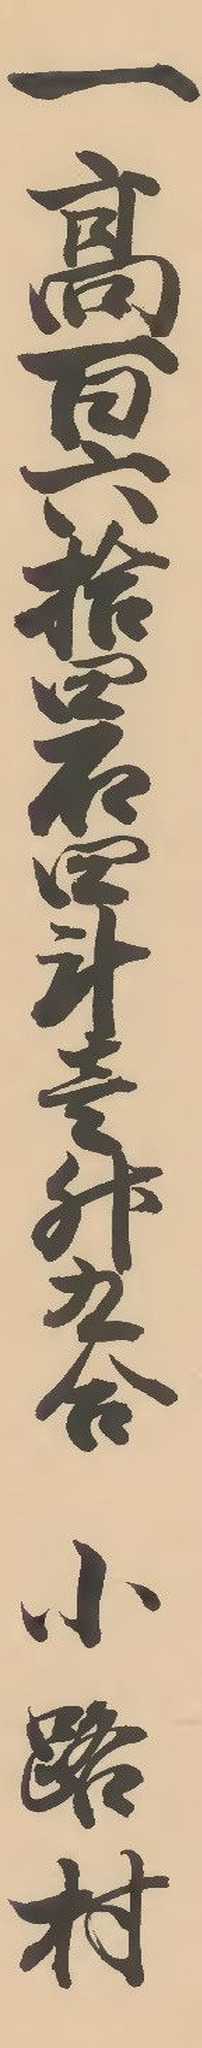一髙百六拾四石四斗壱升九合小路村

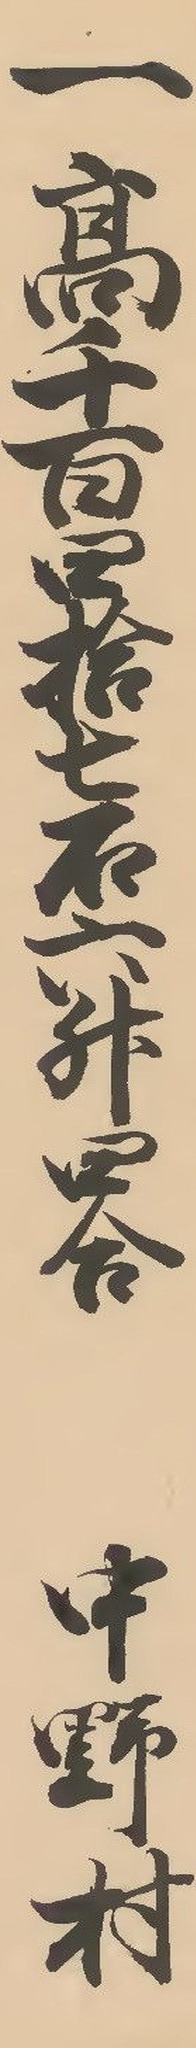一髙千百四拾七石六升四合中野村
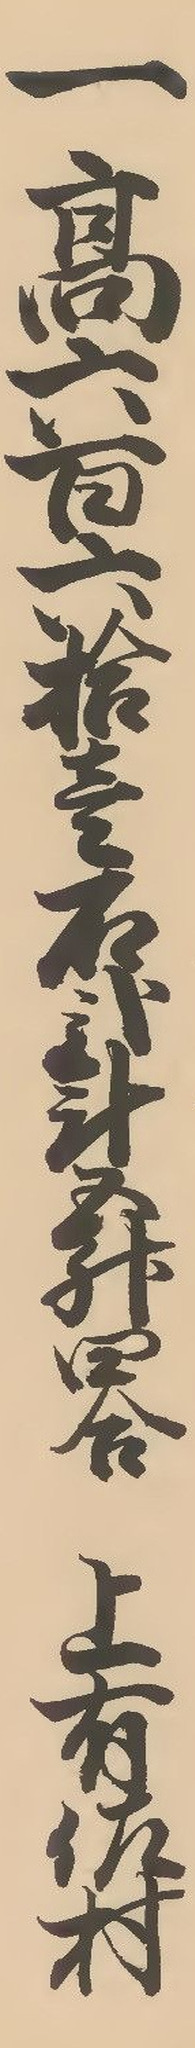一髙六百六拾壱石弐斗五升四合上有佐村
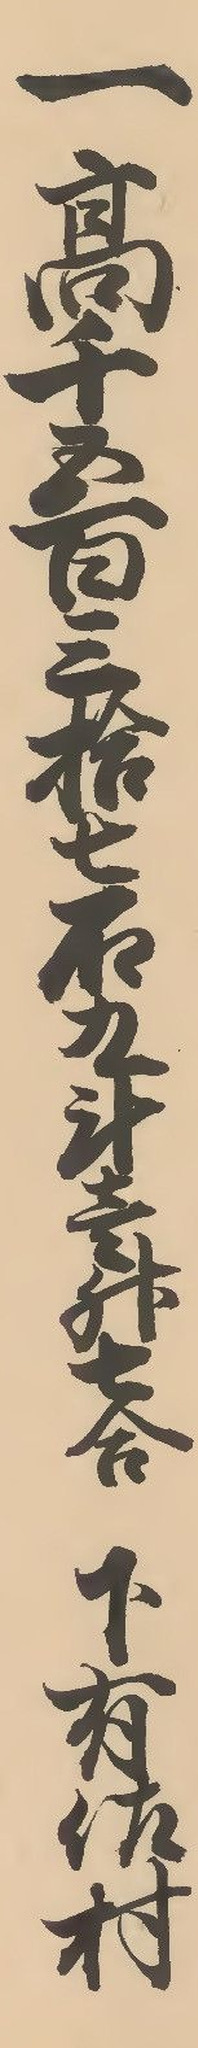一髙千五三拾七石九斗壱升七合下有佐村
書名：肥後国郷帳
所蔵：国立公文書館 National Archives of Japan
